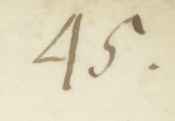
45.
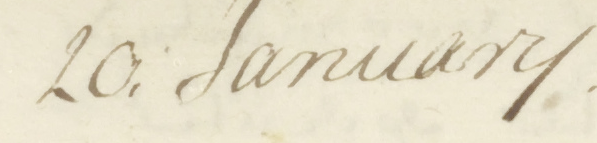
20. January
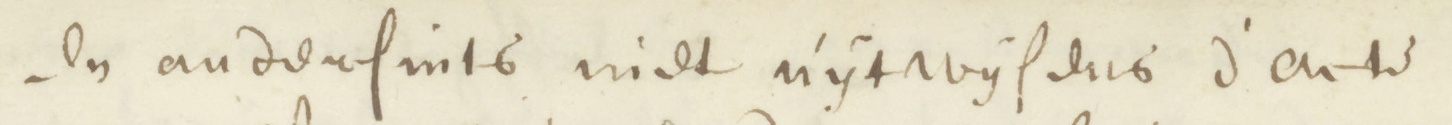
en andersints niet uijtwijsens d'acte
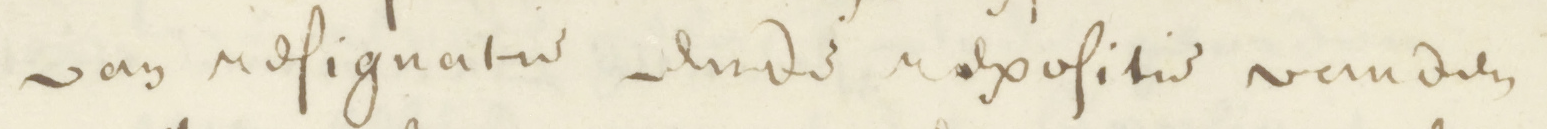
van resignatie ende repositie van den
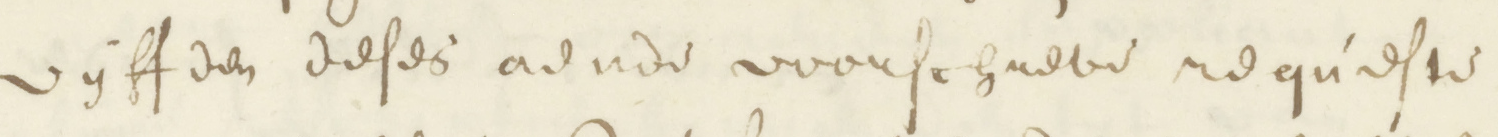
vijffden deses aende voorschreve requeste
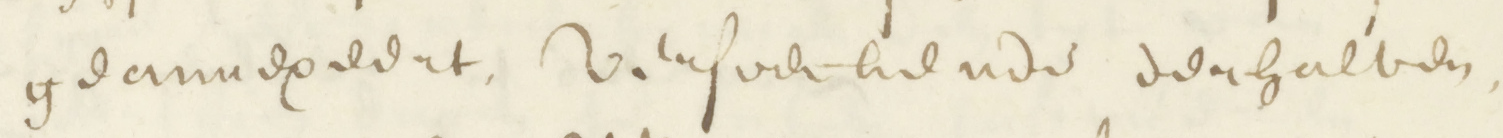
geannexeert, versoeckende derhalven
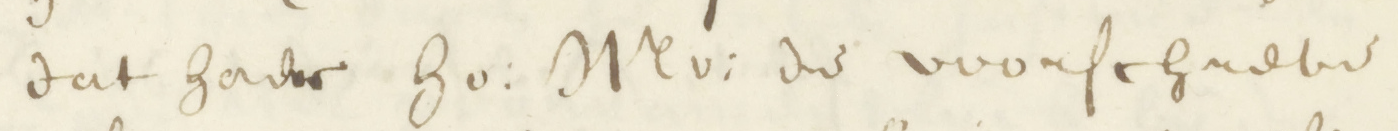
dat haer ho:Mo: de voorschreve
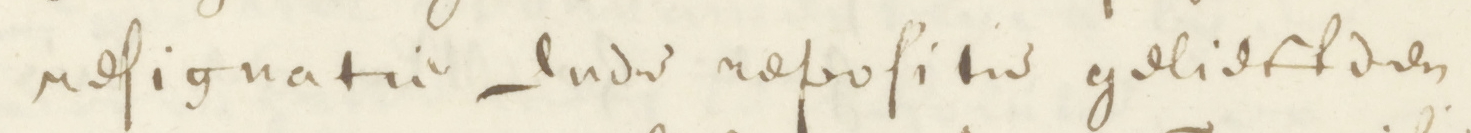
resignatie ende repositie gelieffden
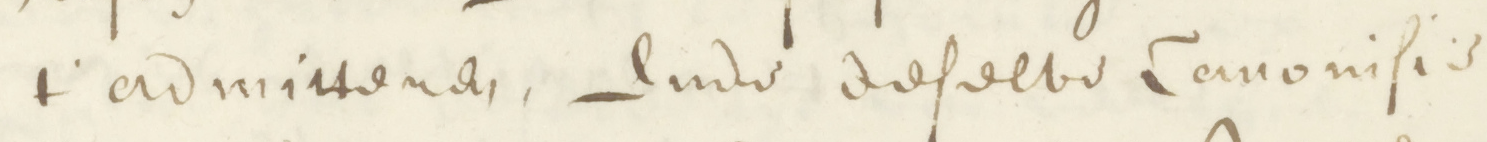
t' admitteren, ende deselve Canonisie
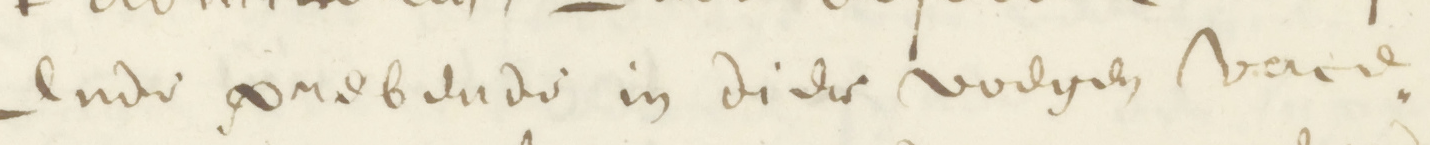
ende prebende in dier voegen vace,,
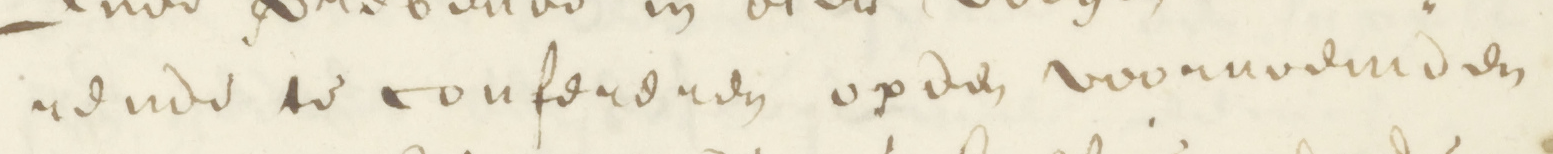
rende te confereren op den voornoemden
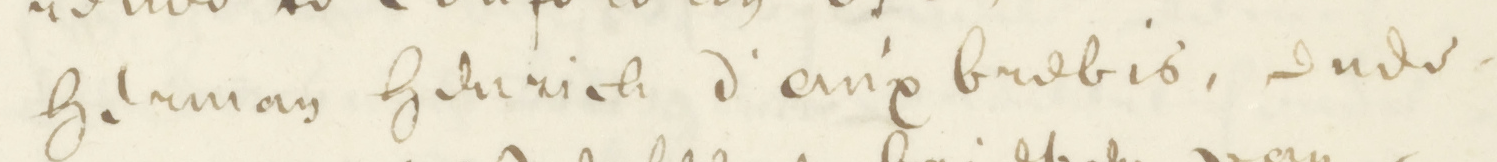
herman henrick d'aux brebis, ende
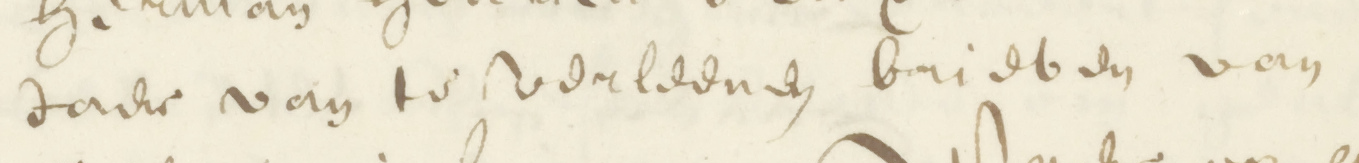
daer van te verleenen brieven van
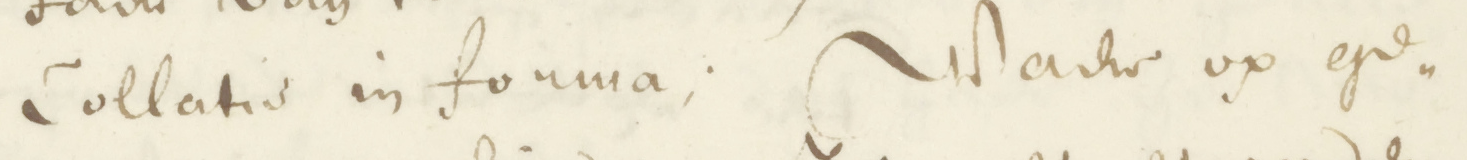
Collatie in forma; Waer op ge,,
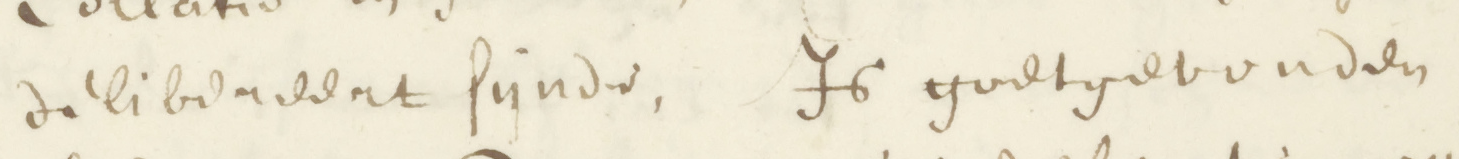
delibereert sijnde, Is goetgevonden
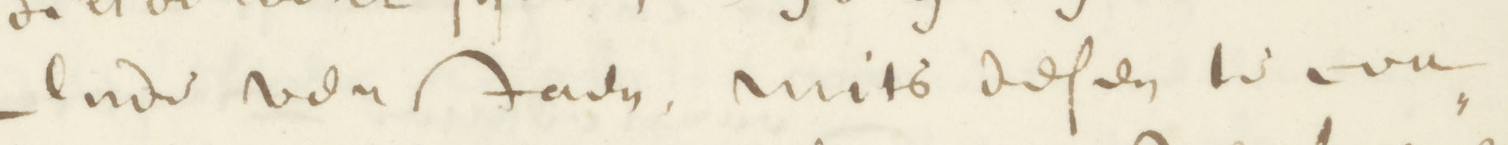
ende verstaen, mits desen te con,,
